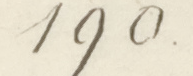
190.
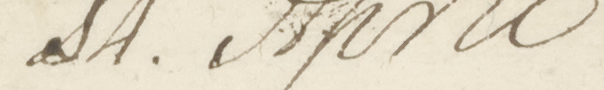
14. April.
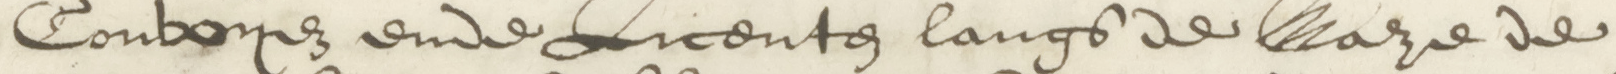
Convoijen ende Licenten langs de Maze de
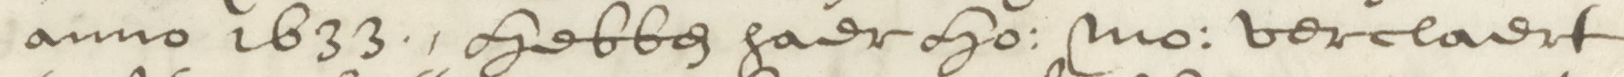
anno 1633., hebben haer Ho:Mo: verclaert
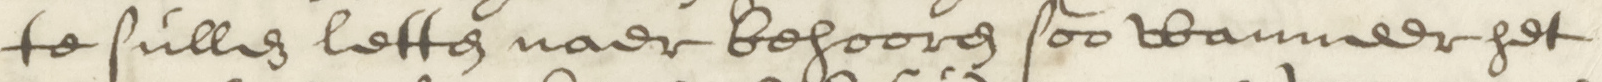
te sullen letten naer behooren soo wanneer het
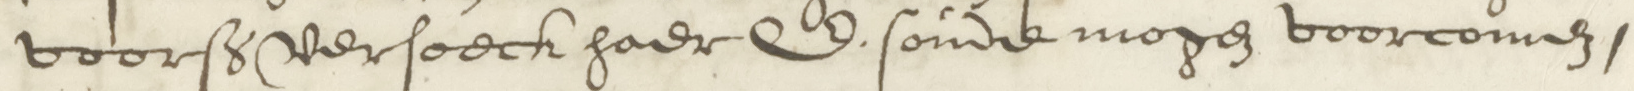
voors Versoeck haer E. soude mogen voorcomen.
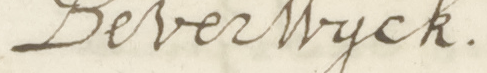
Beverwijck.
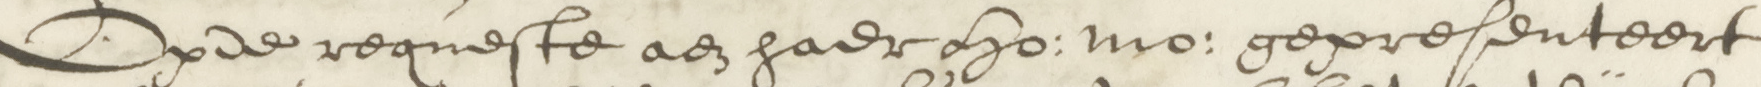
Opde requeste aen haer Ho:Mo: gepresenteert
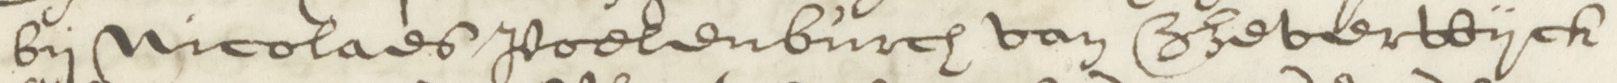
bij Nicolaes Poelenburch van Beverwijck
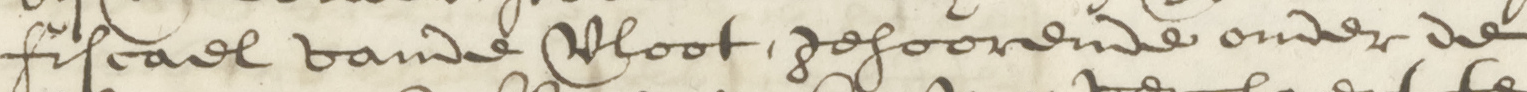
fiscael vande Vloot, gehoorende onder de
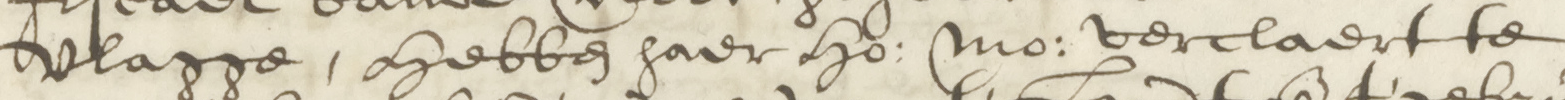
Vlagge, hebben haer Ho:Mo: verclaert te
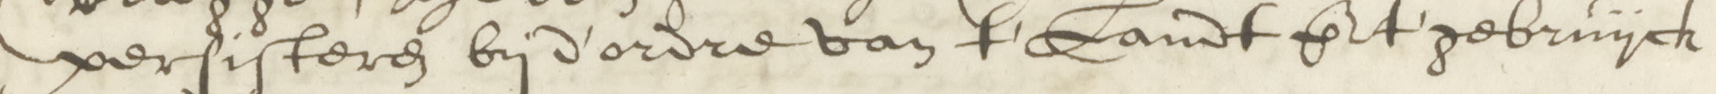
persisteren bij d‛ordre van t'Landt & t‛gebruijck
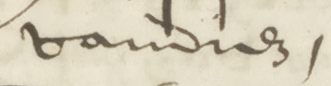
vandien.
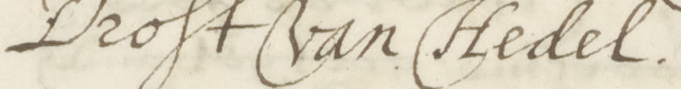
Drost van Hedel.
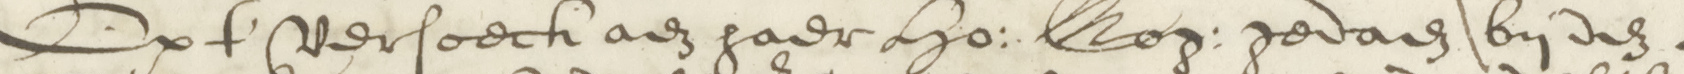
Opt‛ versoeck aen haer Ho:Mo: gedaen bij den
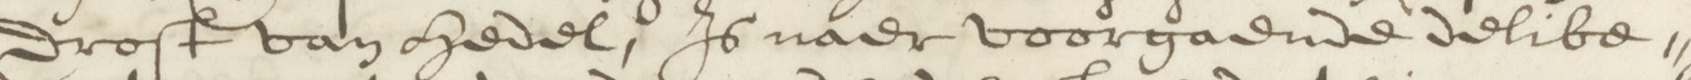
Drost van Hedel, Is naer voorgaende delibe„
